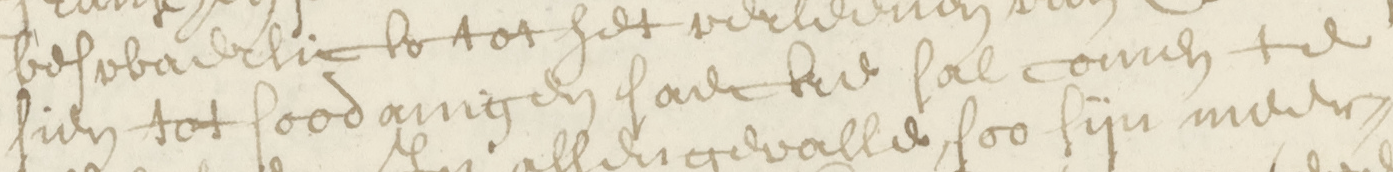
sien tot soodanigen saecke sal comen te
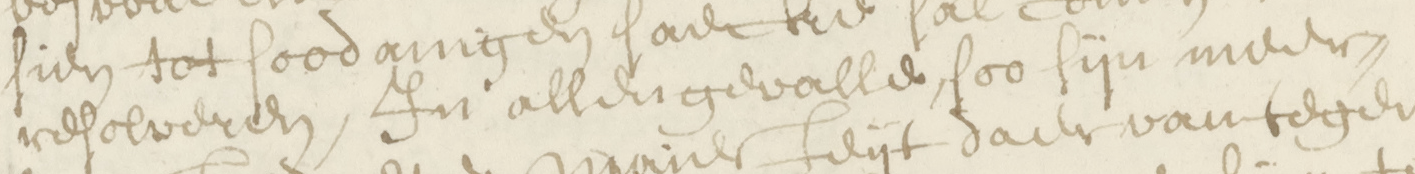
resolveren, In allen gevalle, soo sijn meer„
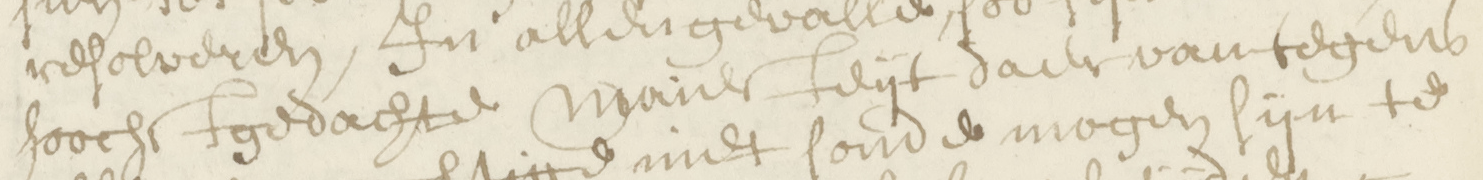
hoochstgedachte Maiesteijt daervan tegens
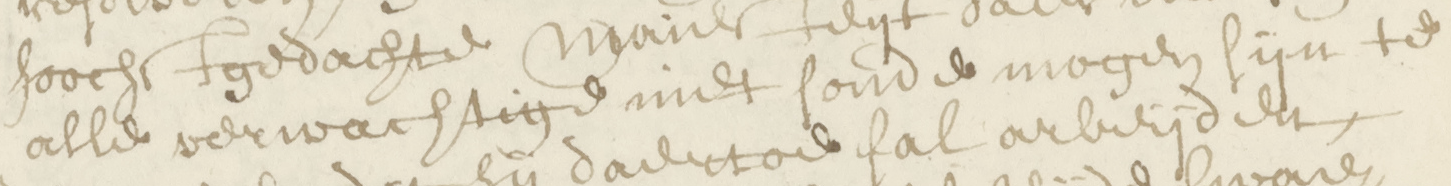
alle verwachtige niet soude mogen sijn te
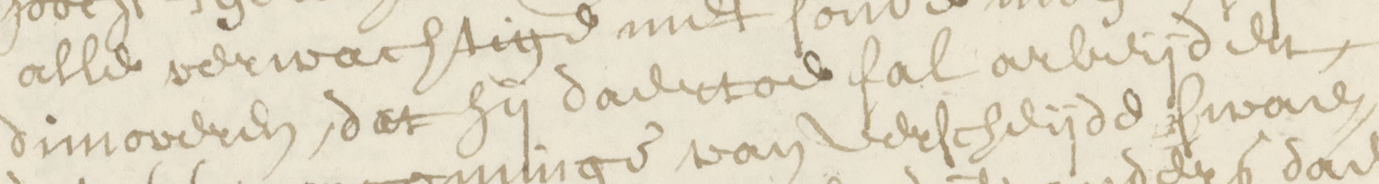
dimoveren, dat hij daertoe sal arbeijden,
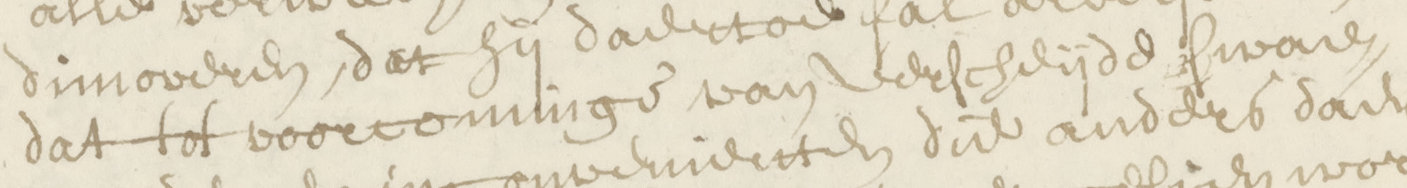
dat tot voorcominge van verscheijde Swae„
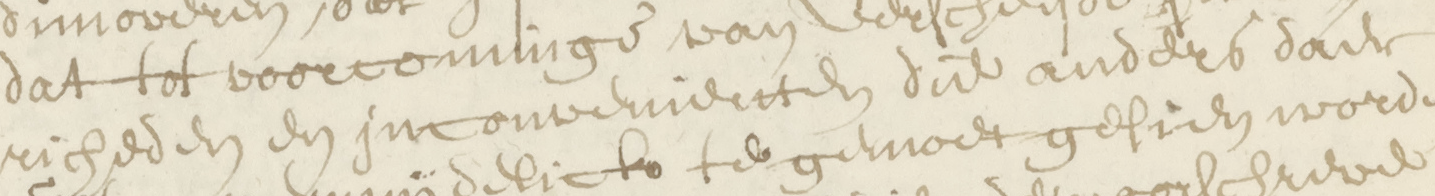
richeden en inconvenienten die anders daer
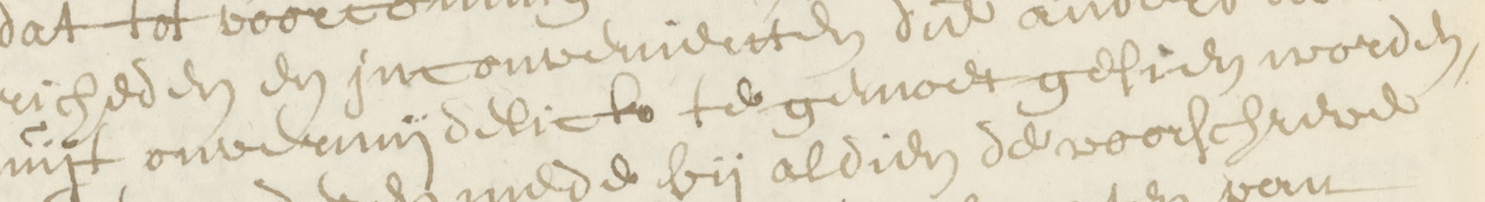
uijt onvermijdelick te gemoet gesien worden,
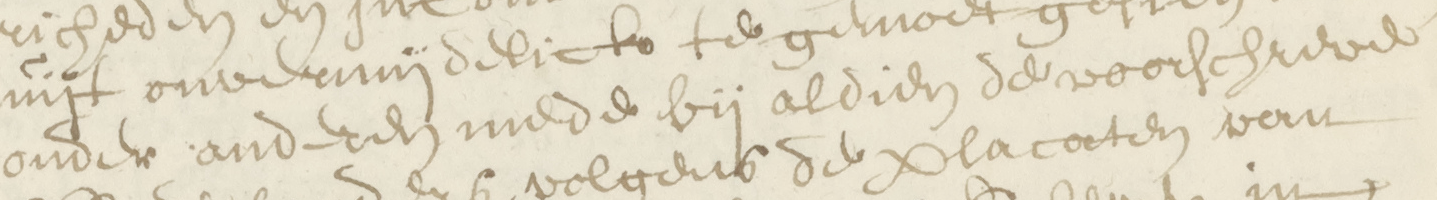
onder anderen mede bij aldien de voorschreve
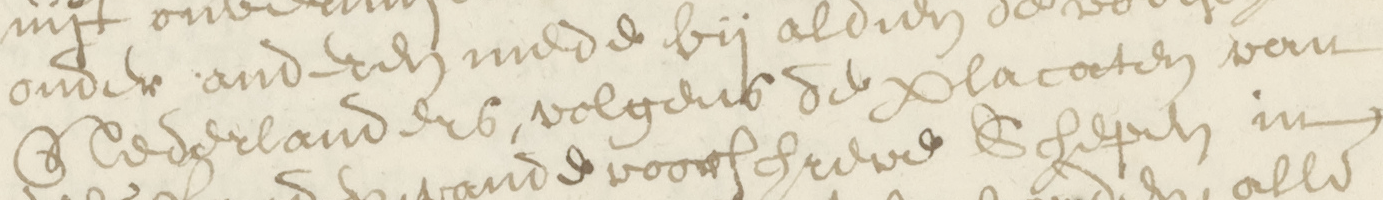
Nederlanders, volgens de placaten van
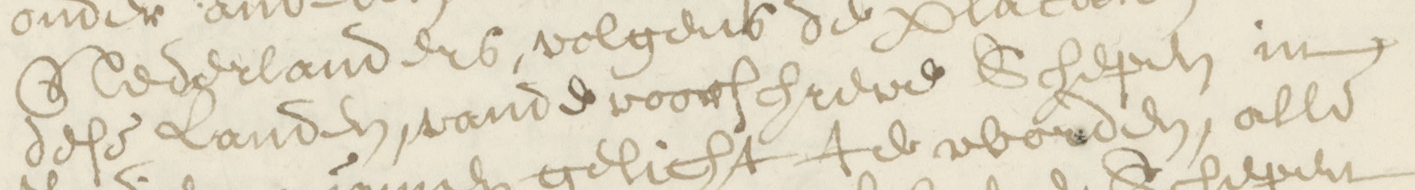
dese Landen, vande voorschreve Schepen in,
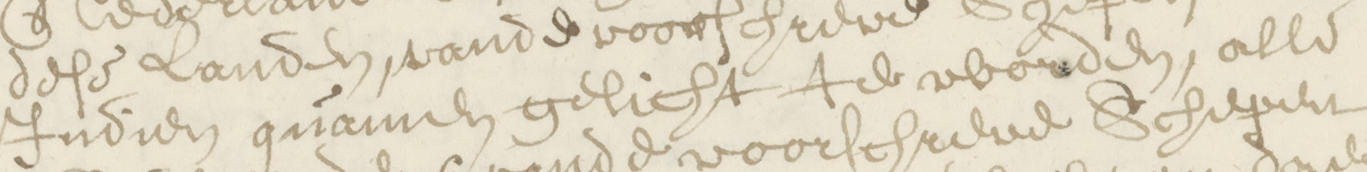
Indien quamen gelicht te worden, alle
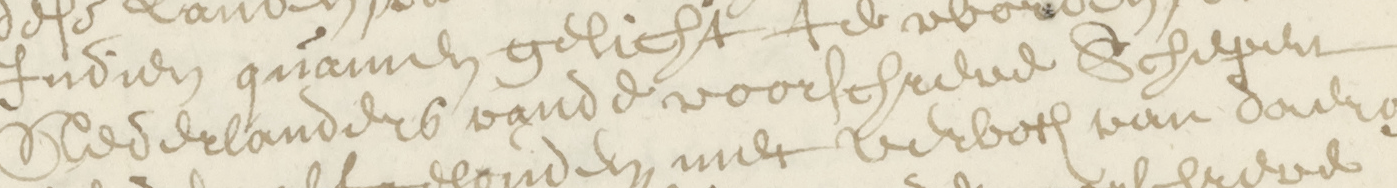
Nederlanders vande voorschreve Schepen
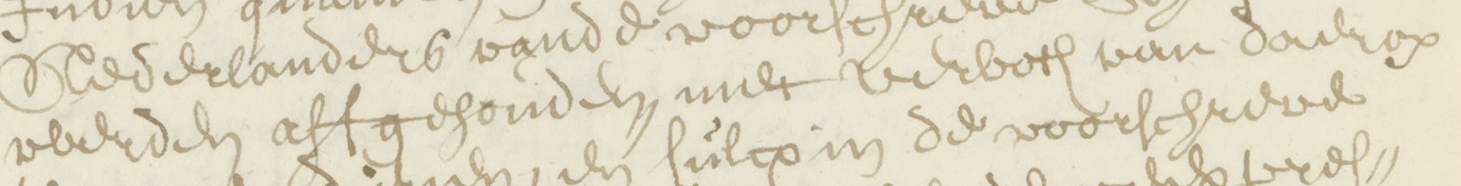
werden affgehouden, met verboth van daerop
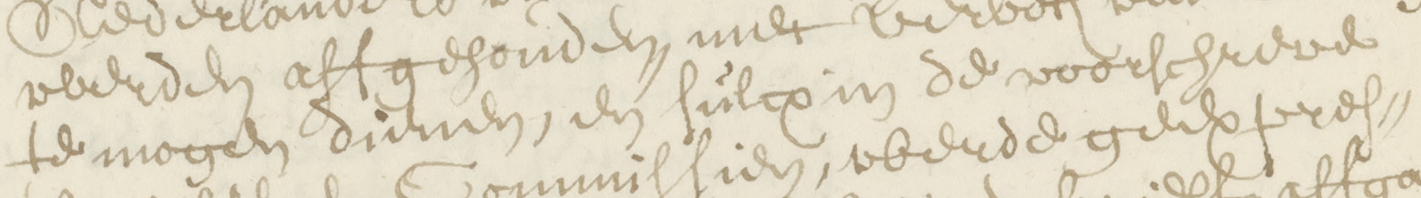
te mogen dienen, en sulcx in de voorschreve
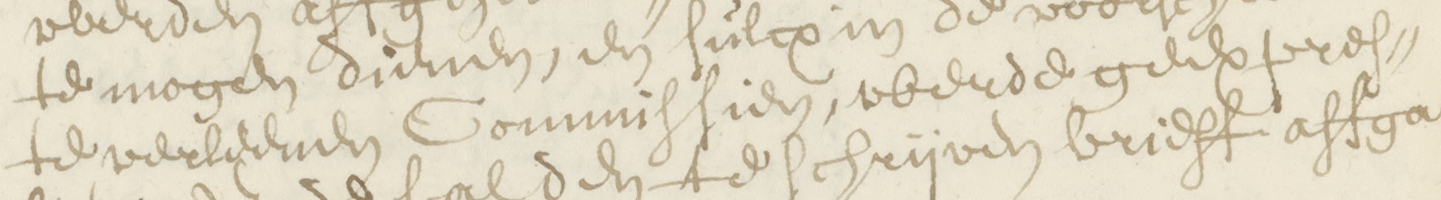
te verleenen Commissien, werde geexpres„
